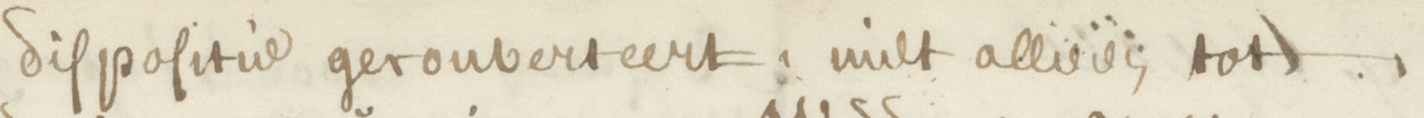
dispositie geconverteert; niet alleen tot
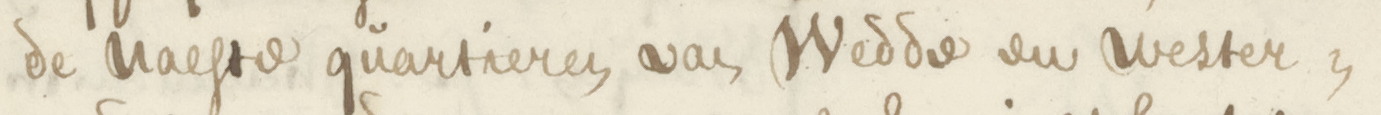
de naeste quartieren van Wedde en Wester„
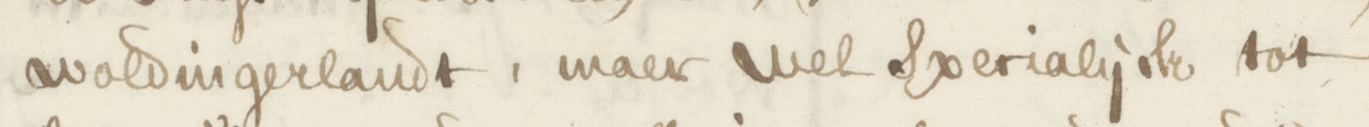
„woldingerlandt, maer wel specialijck tot
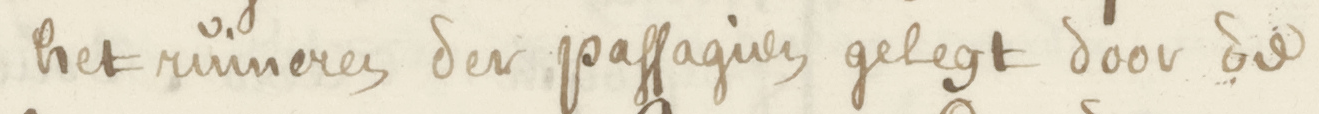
het ruineren der passagien gelegt door de
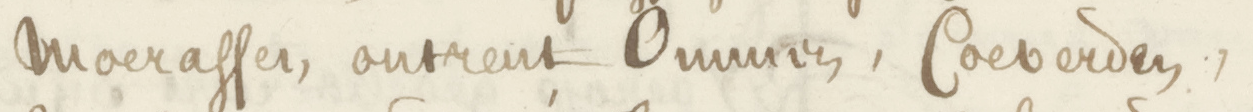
moerassen ontrent Ommen, Coeverden,
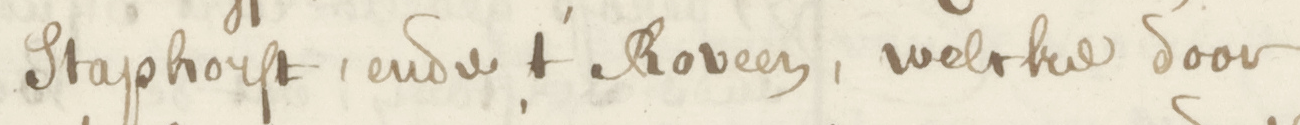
Staphorst, ende t‛ Roveen, welcke door
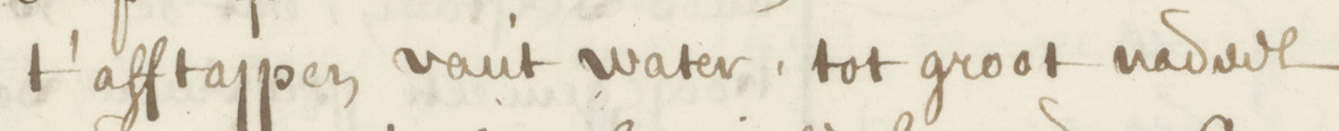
t' afftappen vant water, tot groot nadeel
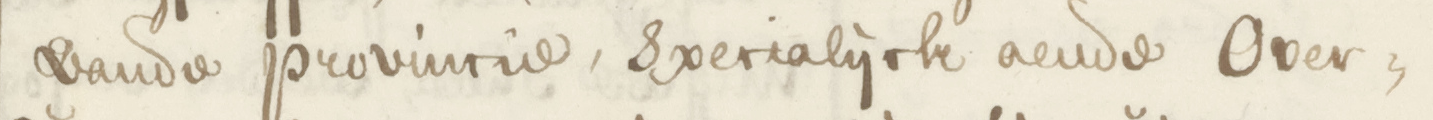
vande provincie, specialijck aende Over„
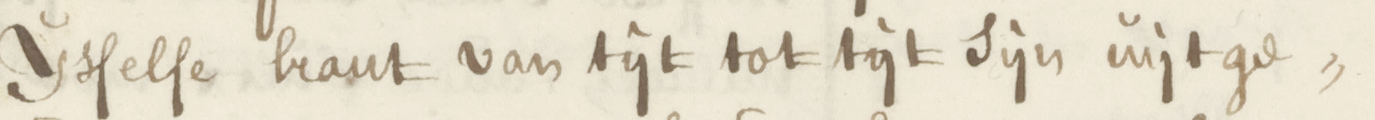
„IJsselse kant van tijt tot tijt sijn uijtge„
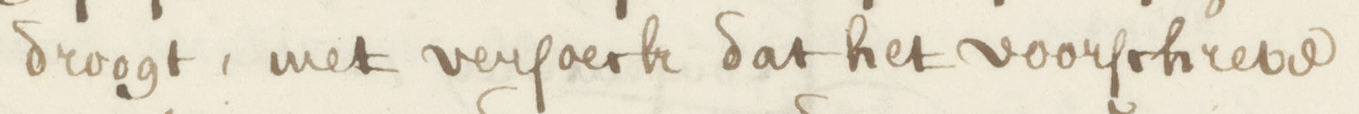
„droogt, met versoeck dat het voorschreve
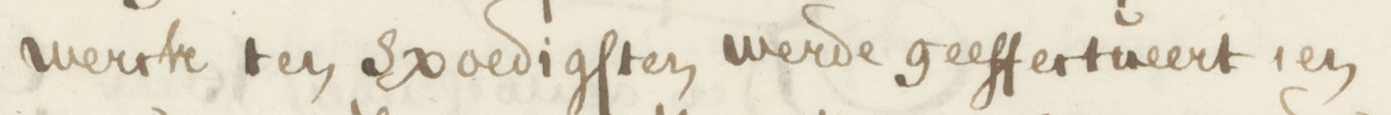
werck ten spoedigsten werde geeffectueert, en
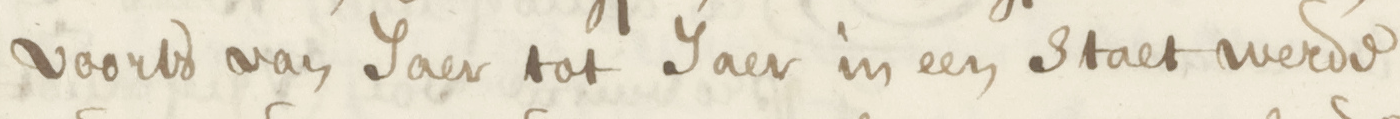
voorts van Jaer tot Jaer in een Staet werde
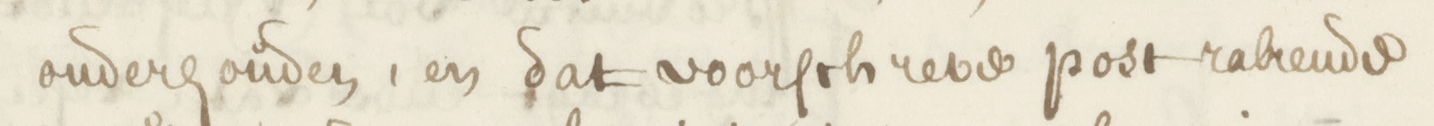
onderhouden, en dat voorschreve post rakende
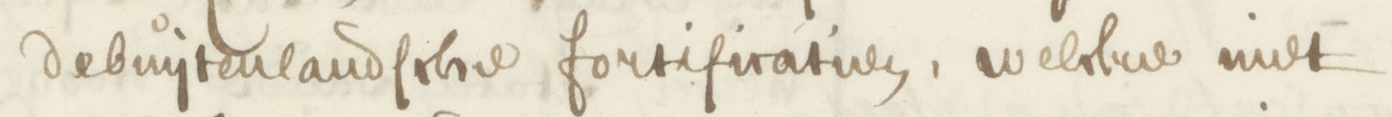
de buijtenlandsche fortificatien, welcke niet
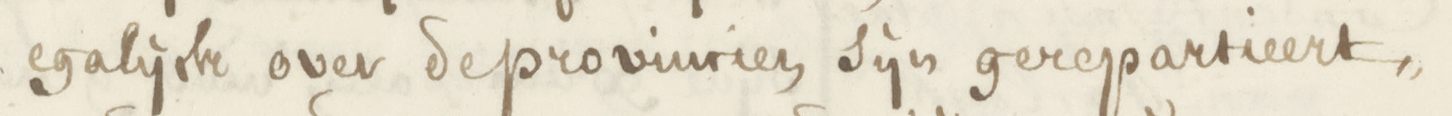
egalijck over de provincien sijn gerepartieert,
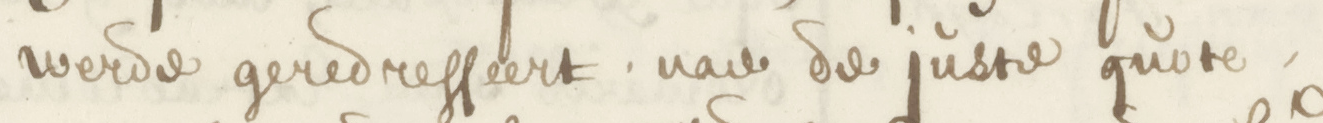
werde geredresseert, nae de juste quote,
